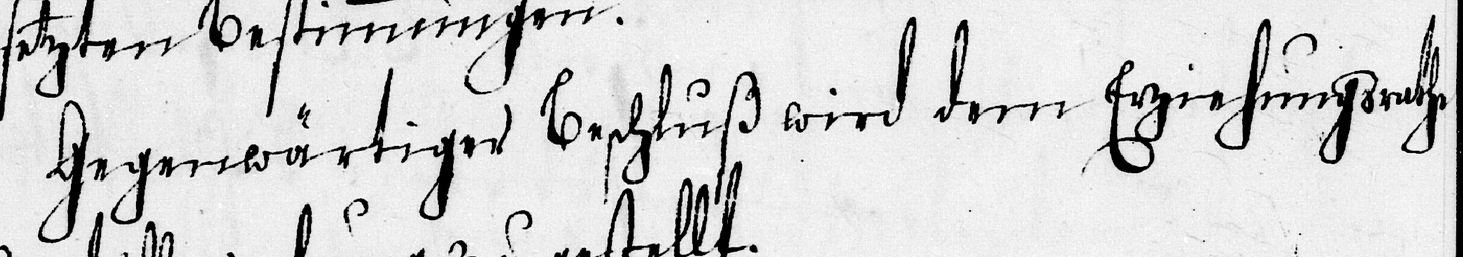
Gegenwärtiger Beschluß wird dem Erziehungsrathe
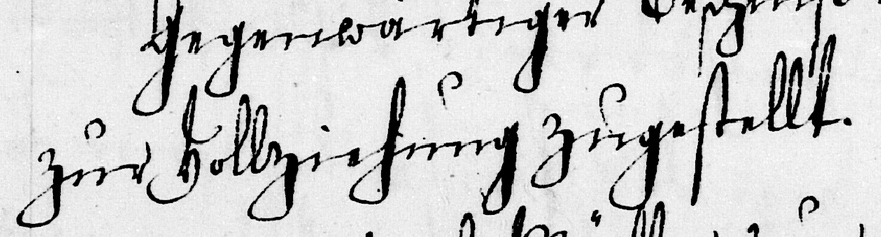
zur Vollziehung zugestellt.
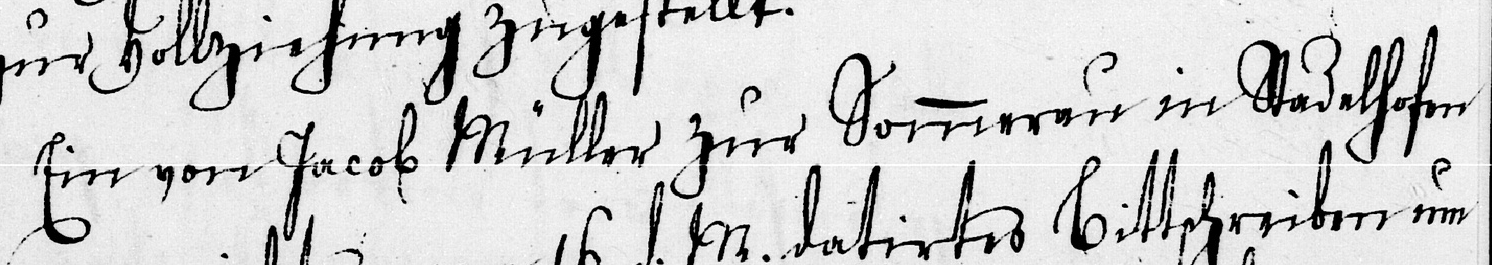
Ein von Jacob Müller zur Sommerau in Stadelhofen
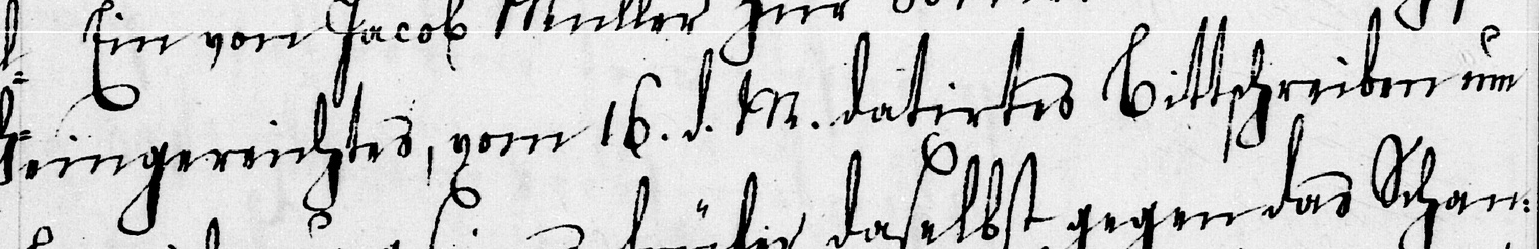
eingereichtes, vom 16. d. M. datirtes Bittschreiben um
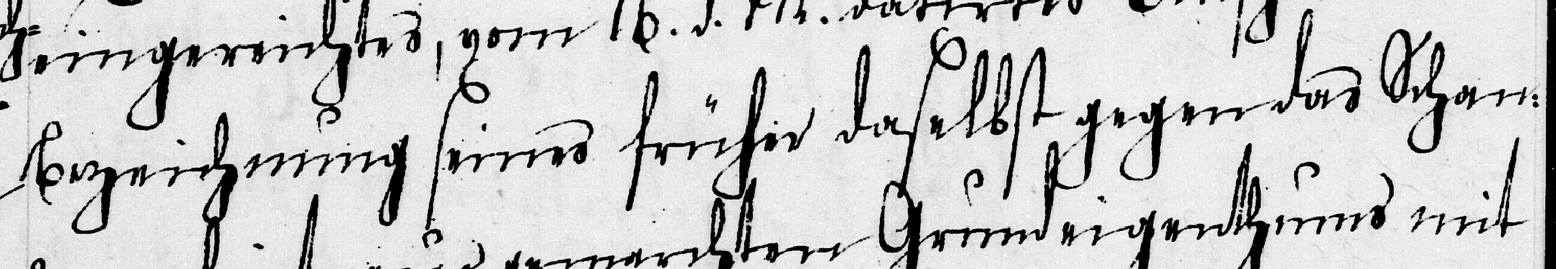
Bezeichnung seines früher daselbst gegen das Schan¬
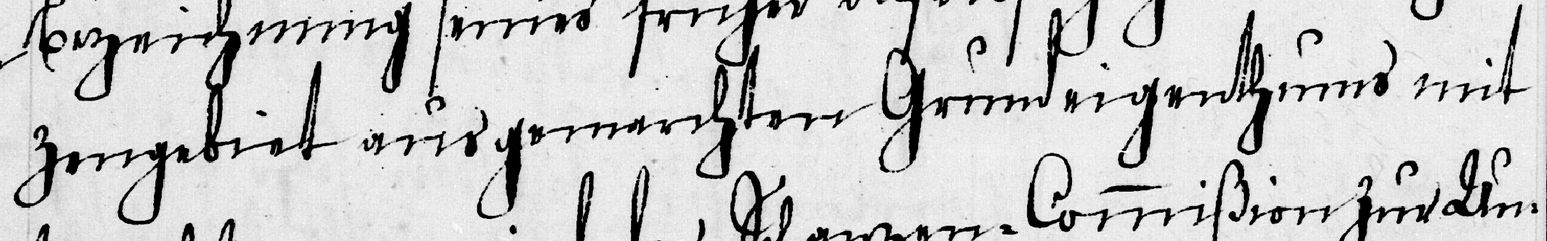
zengebiet ausgemarchten Grundeigenthums mit
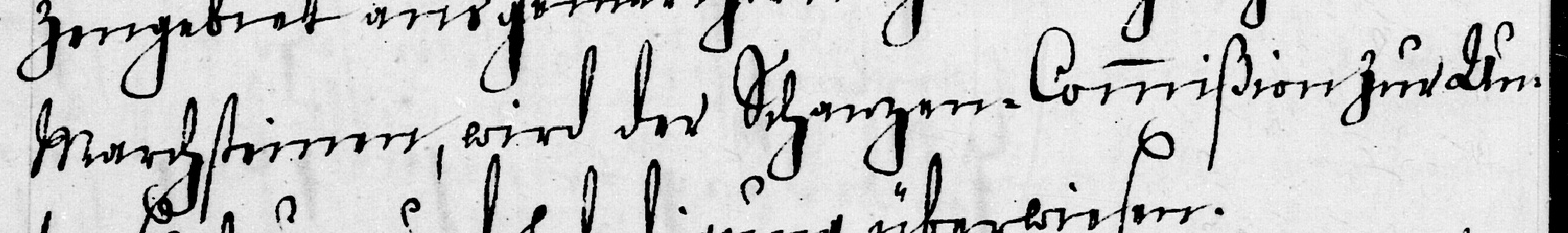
Marchsteinen, wird der Schanzen-Commißion zur Un¬
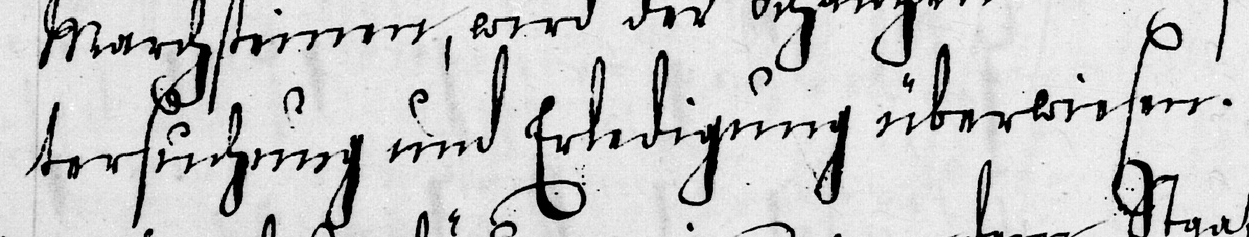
tersuchung und Erledigung überwiesen.
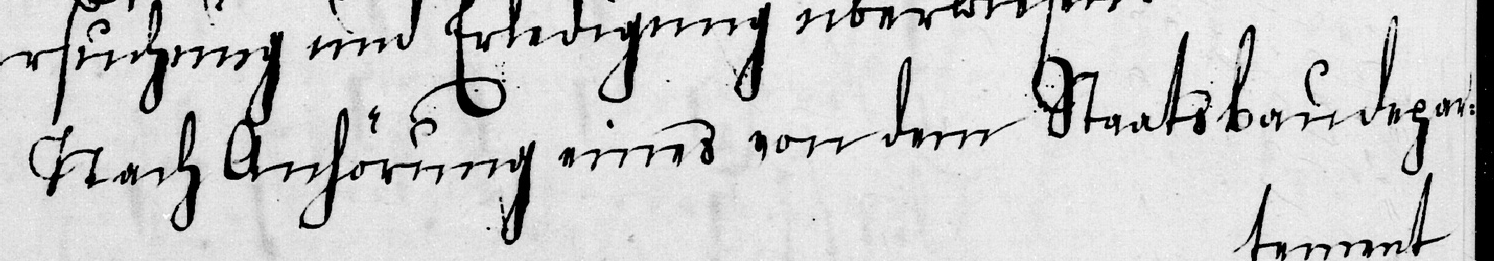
Nach Anhörung eines von dem Staatsbaudepar-
